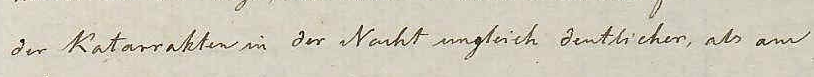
der Katarrakten in der Nacht ungleich deutlicher, als am
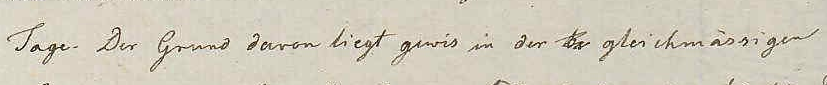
Tage. Der Grund davon liegt gewis in der gleichmässigen
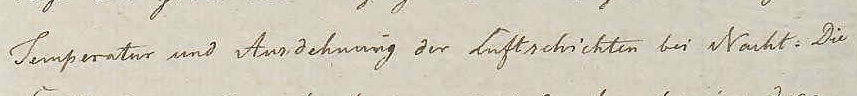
Temperatur und Ausdehnung der Luftschichten bei Nacht. Die
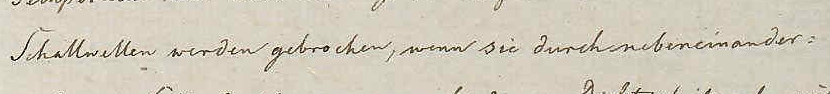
Schallwellen werden gebrochen, wenn sie durch nebeneinander-
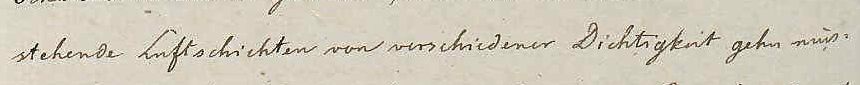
stehende Luftschichten von verschiedener Dichtigkeit gehn müs-
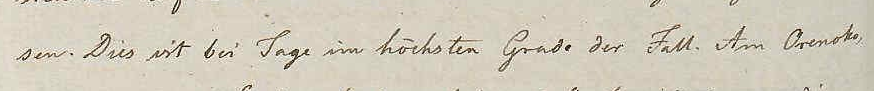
sen. Dies ist bei Tage im höchsten Grade der Fall. Am Orenoko,
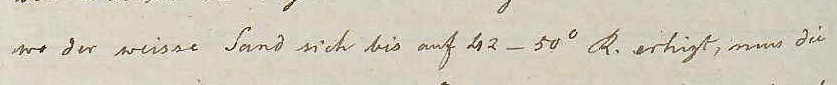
wo der weisse Sand sich bis auf 42–50° R. erhizt, mus die
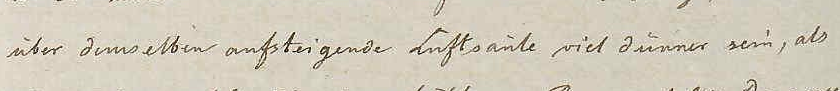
über demselben aufsteigende Luftsäule viel dünner sein, als
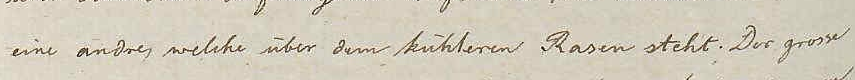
eine andre, welche über dem kühleren Rasen steht. Der grosse
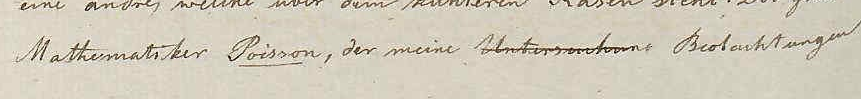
Mathematiker Poisson, der meine UntersuchunBeobachtungen
